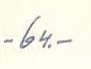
64
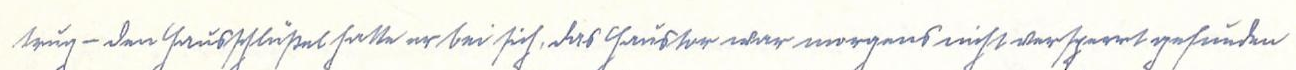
trug -den Hausschlüßel hatte er bei sich, das Haustor war morgens nicht versperrt gefunden
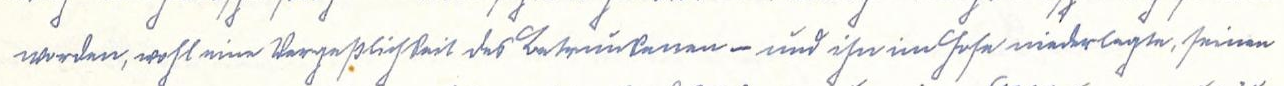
worden, wohl eine Vergeßlichkeit des Betrunkenen- und ihn im Hofe niederlegte, seinen
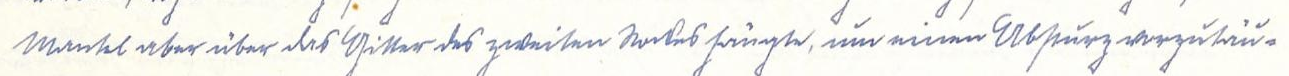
Mantel aber über das Gitter des zweiten Stockes hängte, um einen Absturz vorzutäu-
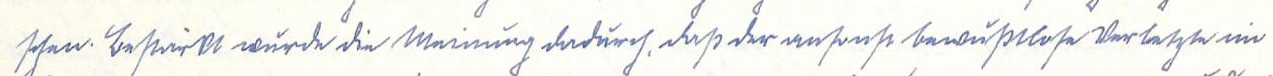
schen. Bewirkt wurde die Meinung dadurch, daß der ansonst bewußtlose Verletzte im
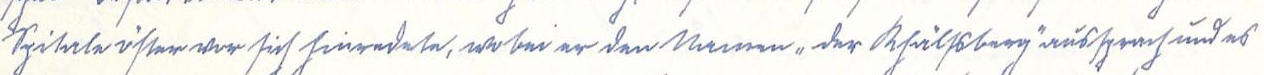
Spitale öfter vor sich hin redete, wobei er den Namen „der Khälsberg“ aussprach und es
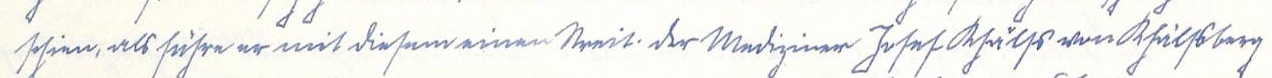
schien, als führe er mit diesem einen Streit. Der Mediziner Josef Khäls von Kählsberg
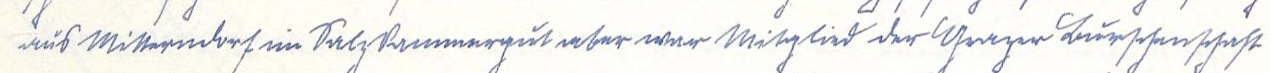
aus Mitterndorf im Salzkammergut aber war Mitglied der Grazer Burschenschaft
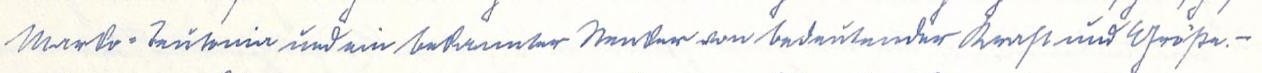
Mark-Teutonia und ein bekannter Stenker von bedeutender Kraft und Größe.-
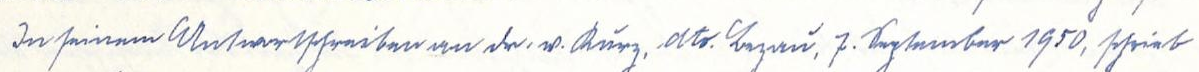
In seinem Antwortschreiben an Dr. v. Kurz, dto Bezau, 7. September 1950, schrieb
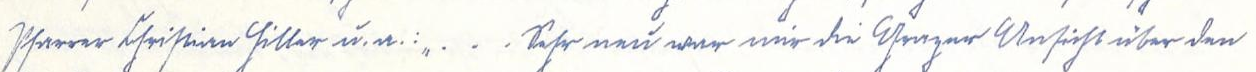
Pfarrer Christian Hiller u. a.: „… Sehr neue war mir die Grazer Ansicht über den
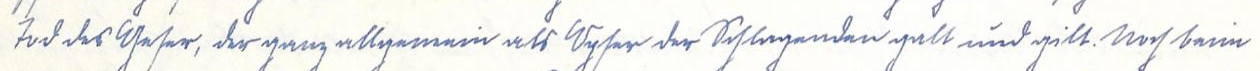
Tod des Geser, der ganz allgemein als Opfer der Schlagenden galt und gilt. Noch beim
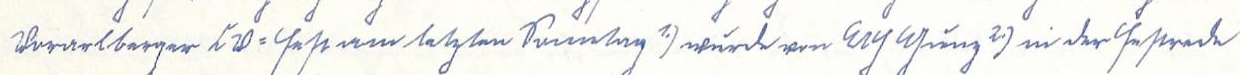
Vorarlberger CV-Fest am letzten Sonntag 1) wurde von AH Gunz 2) in der Festrede
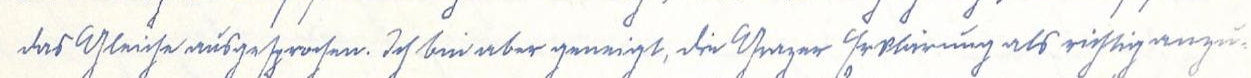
das Gleiche ausgesprochen. Ich bin aber geneigt, die Grazer Erklärung als richtig anzu-
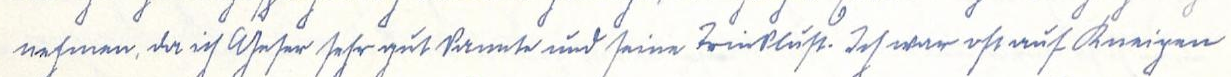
nehmen, da ich Geser sehr gut kannte und seine Trinklust. Ich war oft auf Kneipen
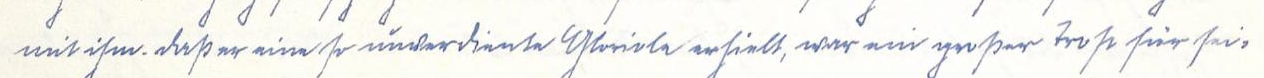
mit ihm. Dass eine so unverdiente Gloriole erhielt, war ein großer Trost für sei-
